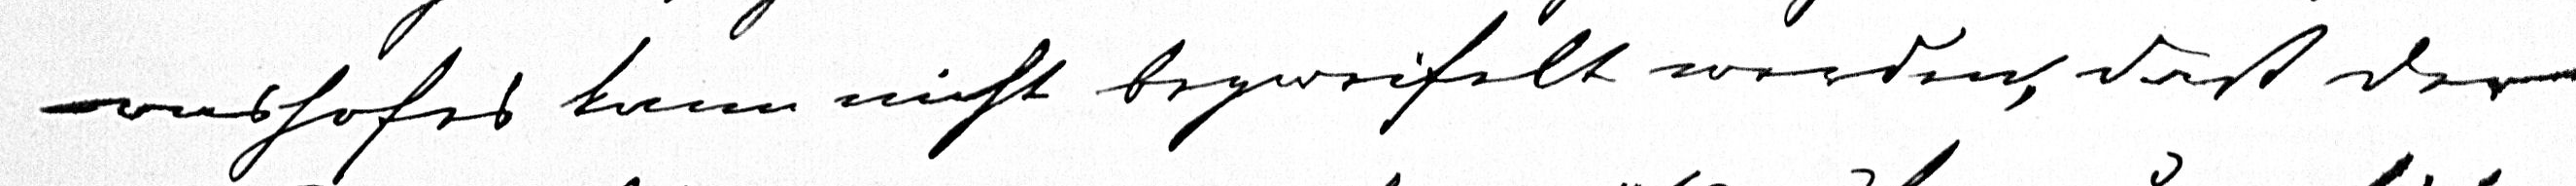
onshofes kann nicht bezweifelt werden, daß der
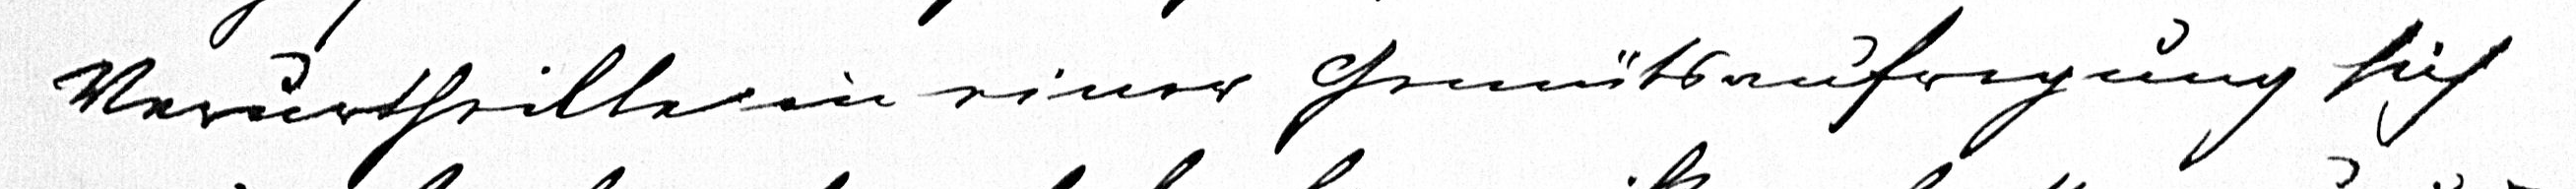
Verurtheilte in einer Gemütsaufregung sich
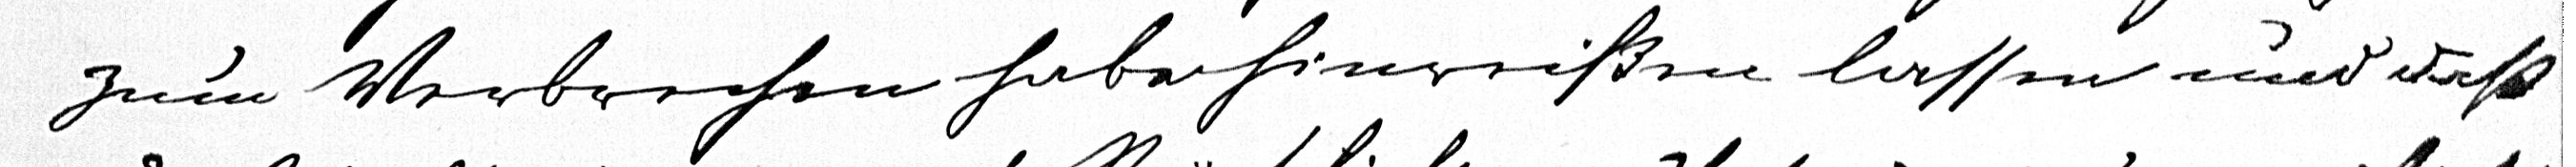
zum Verbrechen habe hinreißen lassen und daß
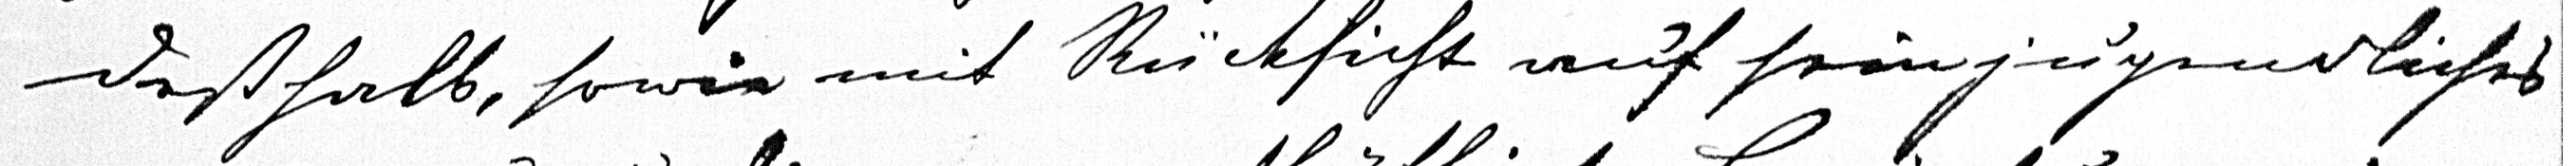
deßhalb, sowie mit Rücksicht auf sein jugendliches
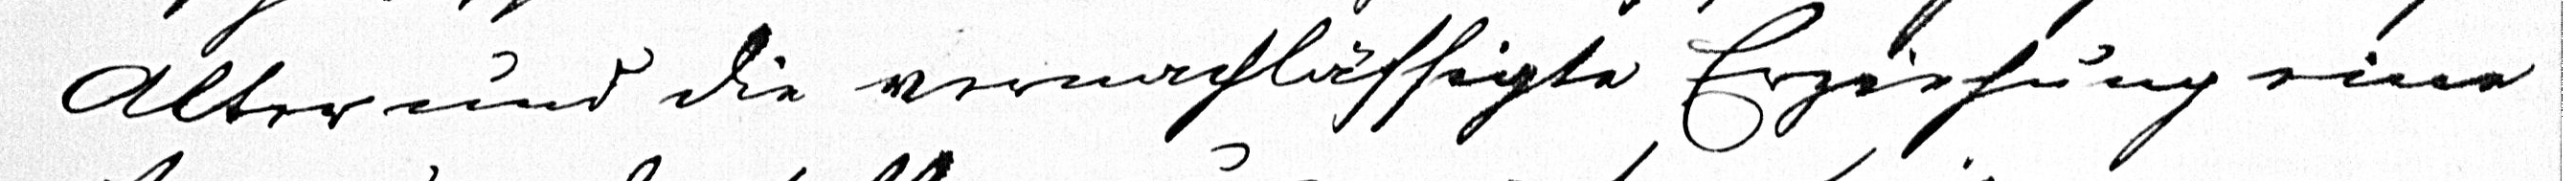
Alter und die vernachlässigte Erziehung eine
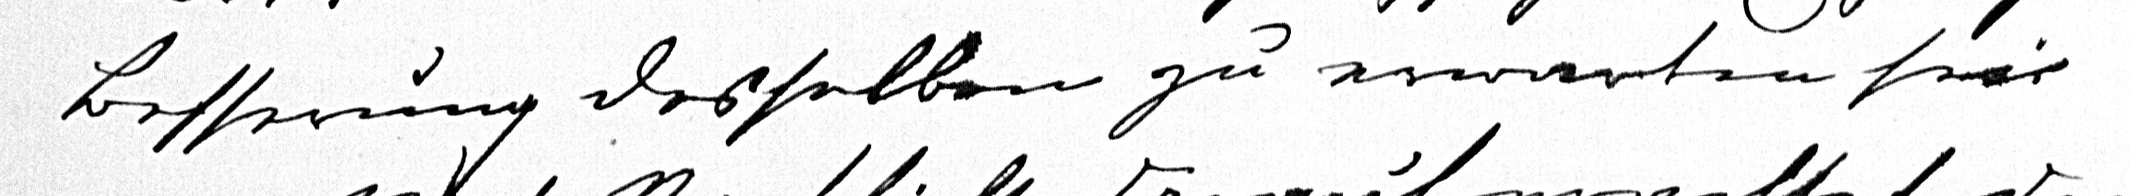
Besserung desselben zu erwarten sxx
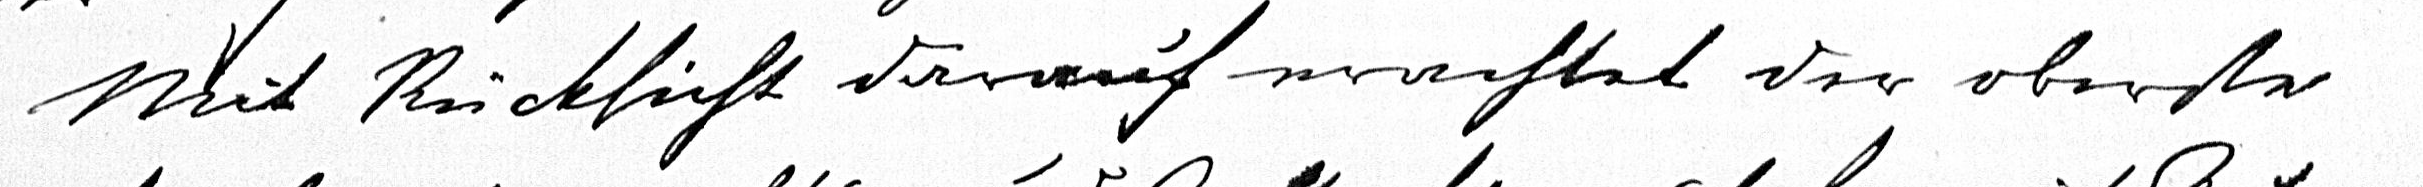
Mit Rücksicht darauf erachtet der oberste
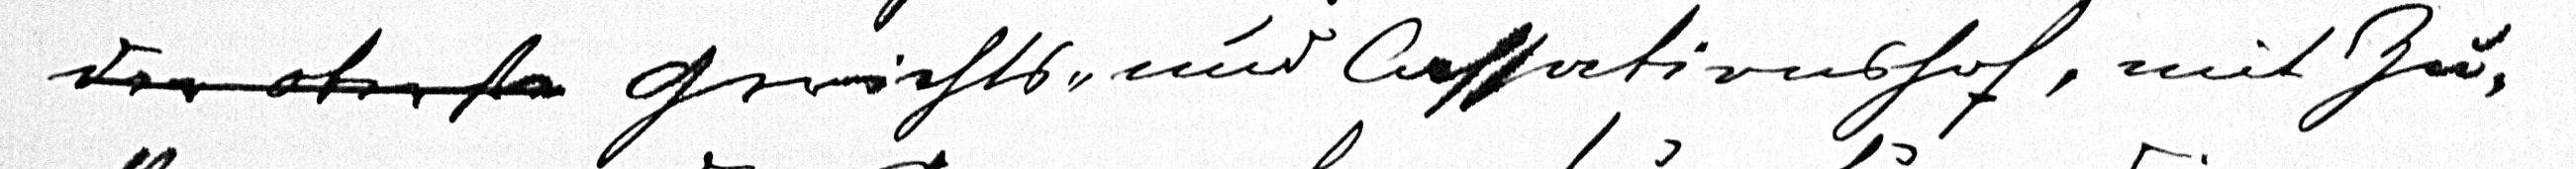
Gerichts- und Cassationshof, mit Zu¬
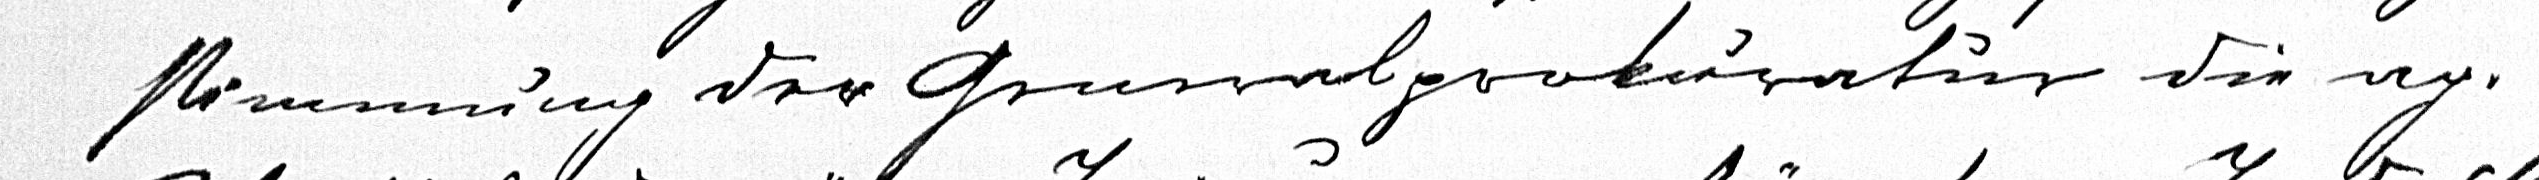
stimmung der Generalprokuratur die ag.
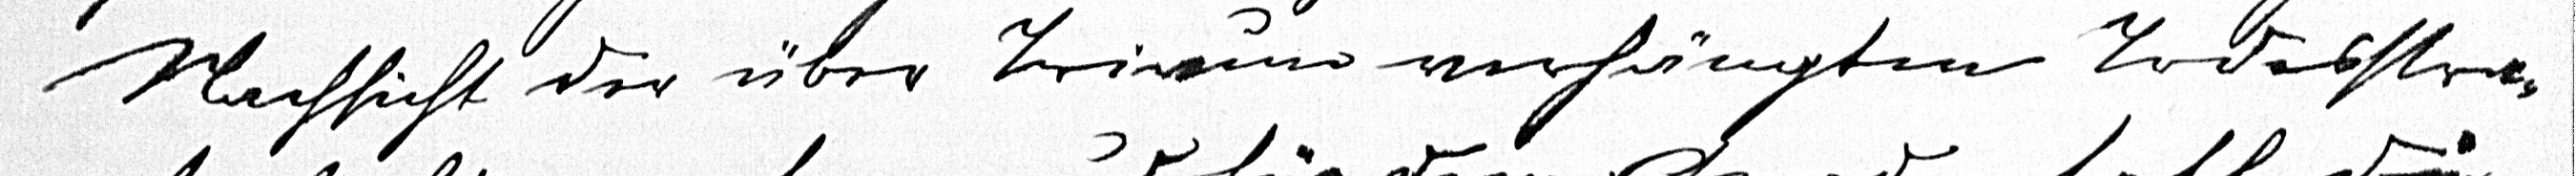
Nachsicht der über Trivun verhängten Todesstra¬
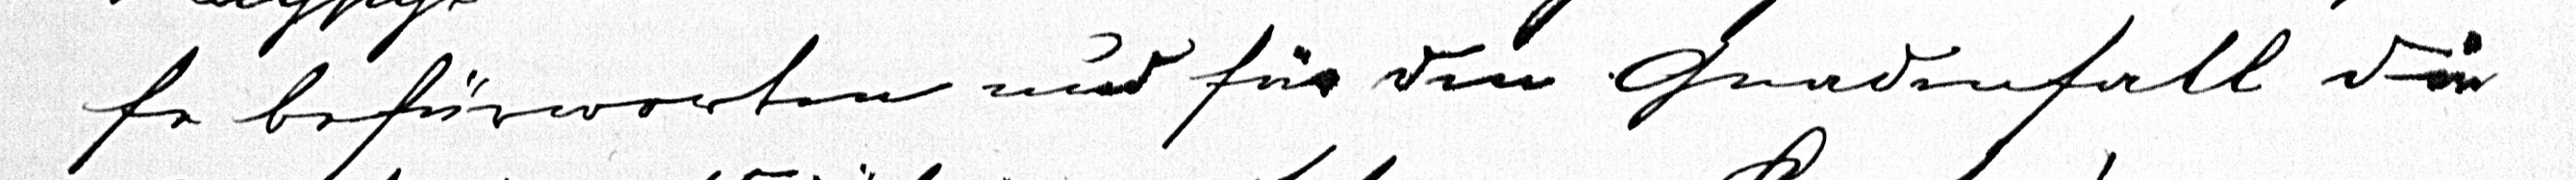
fe befürworten und für den Gnadenfall die
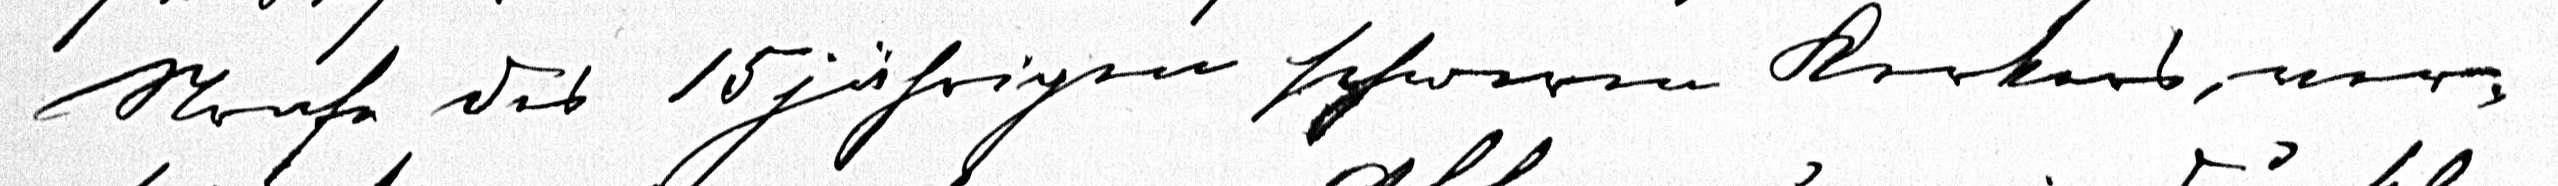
Strafe des 15jährigen schweren Kerkers, ver¬
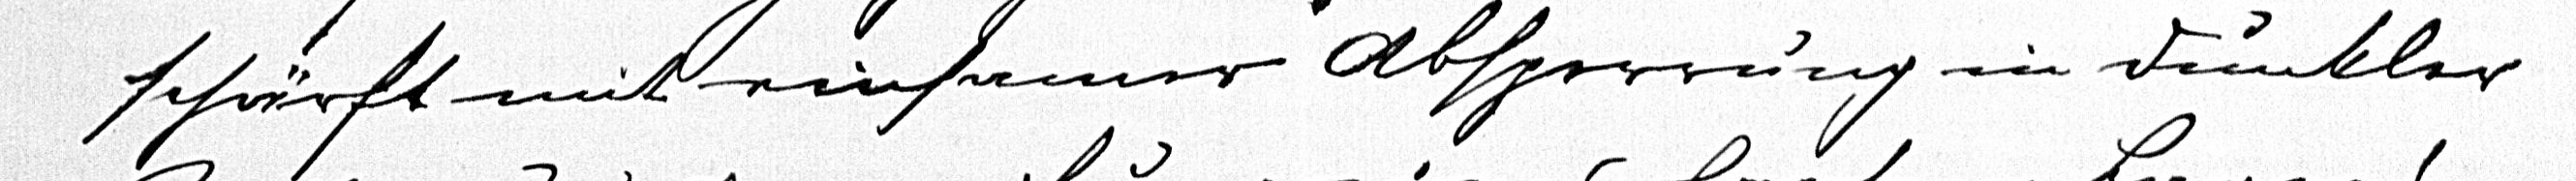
schärft mit einsamer Absperrung in Dunkler
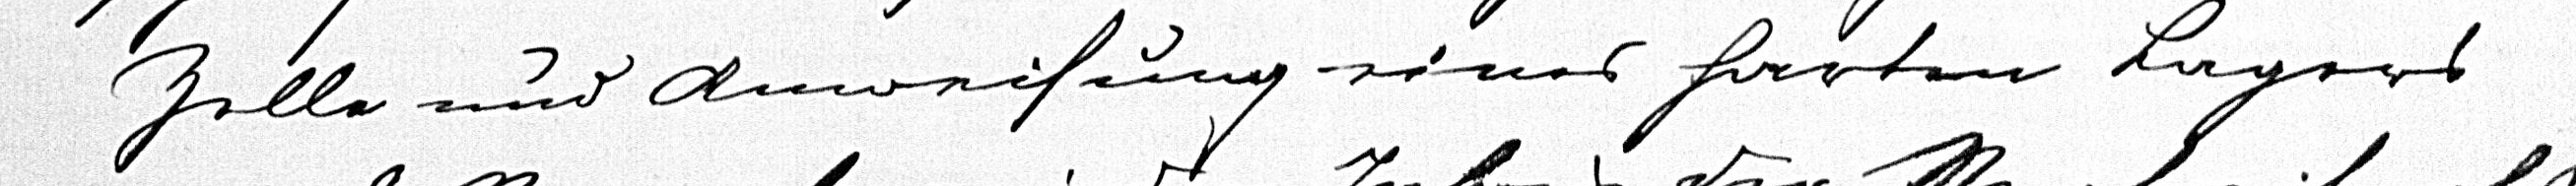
Zolle und Anweisung eines harten Lagers
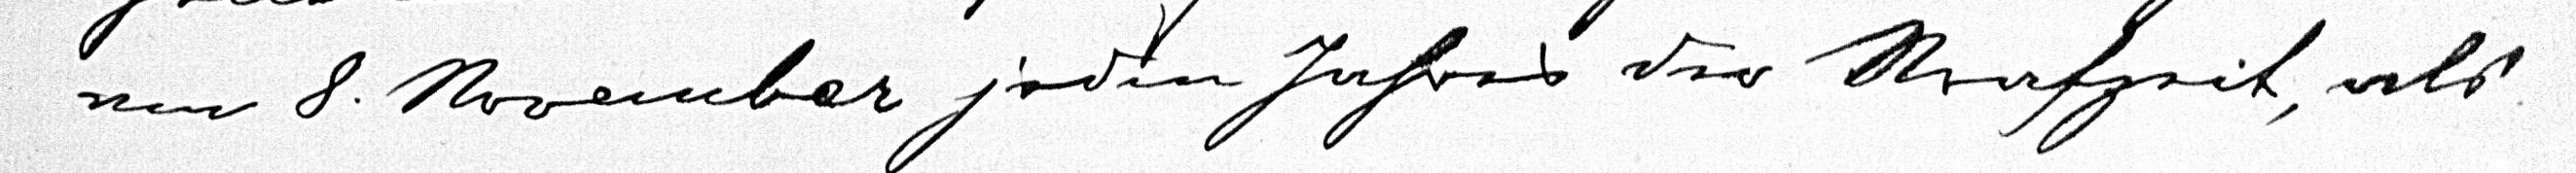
am 8. November jeden Jahres der Strafzeit, als
